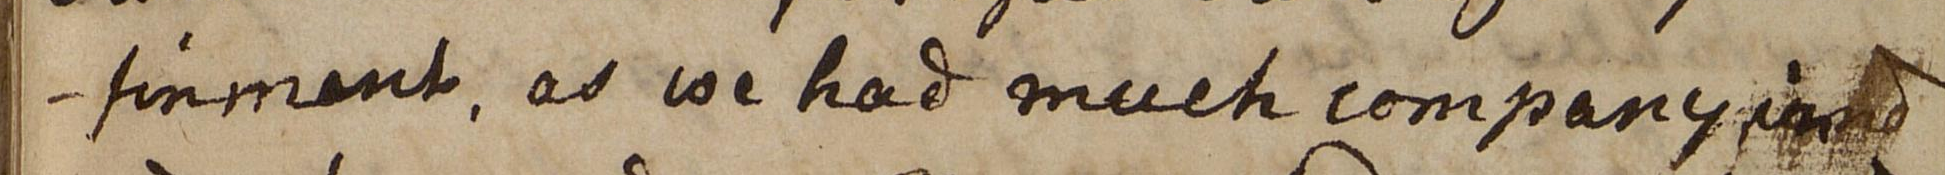-finment, as we had much company and
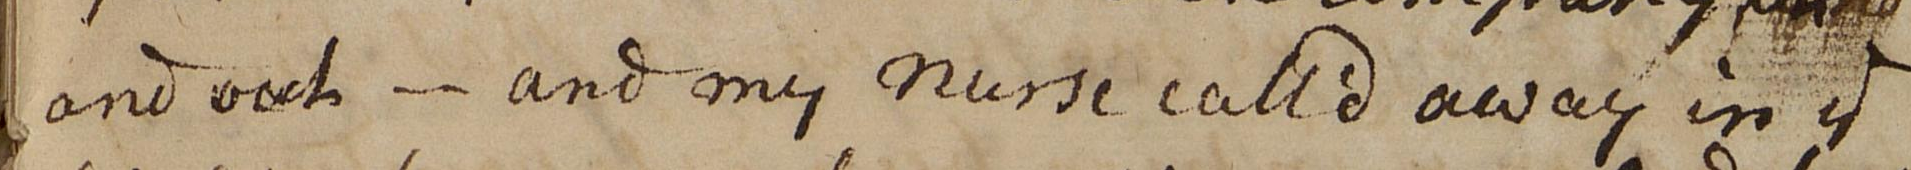and such- and my nurse call'd away in y^e
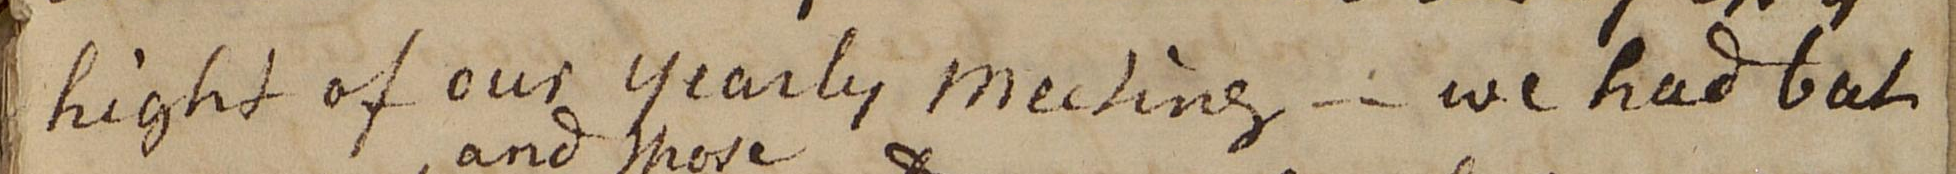hight of our yearly meeting-- we had but
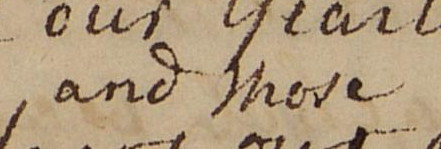and those
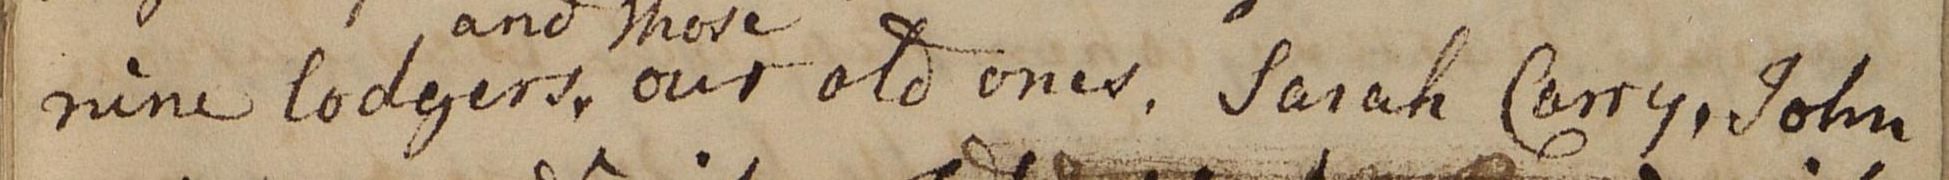nine lodgers, ^ our old ones, Sarah Carry, John
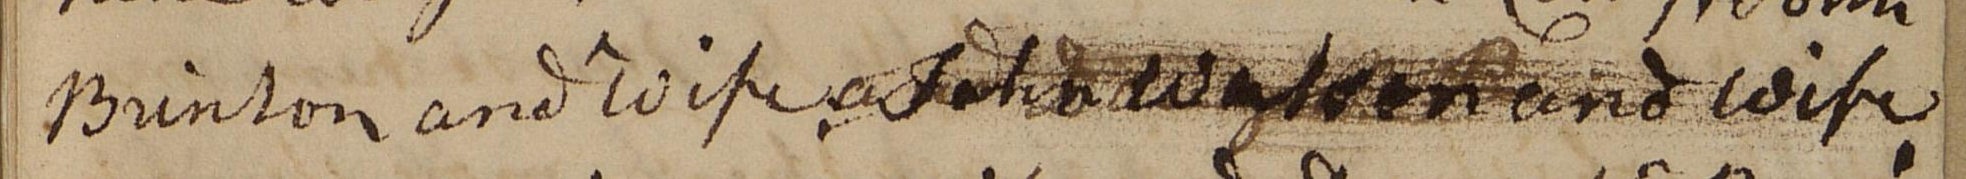Brinton and wife a John Watson and wife
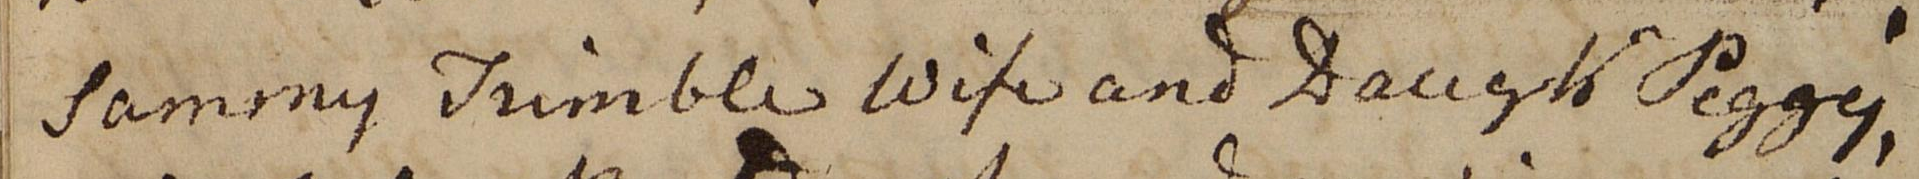Sammy Trimble Wife and Daugh^r Peggy,
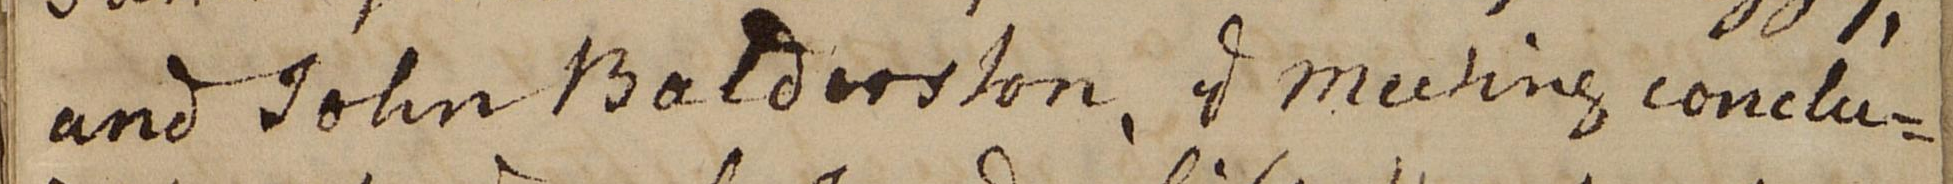and John Balderston, y^e meeting conclu-
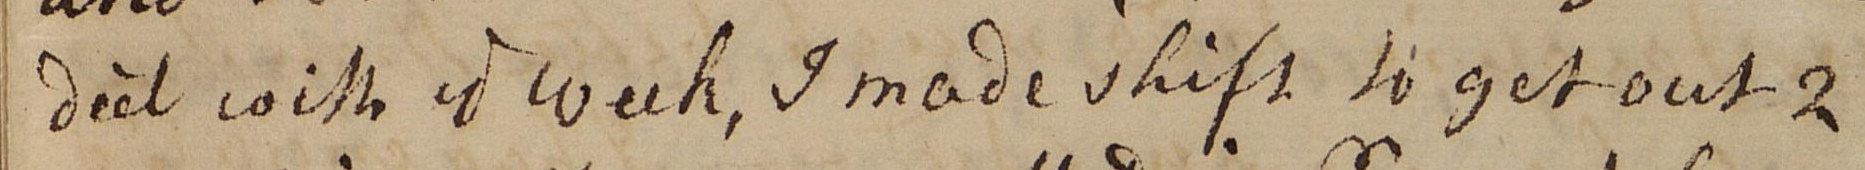deel with y^e week, I made shifs to get out 2
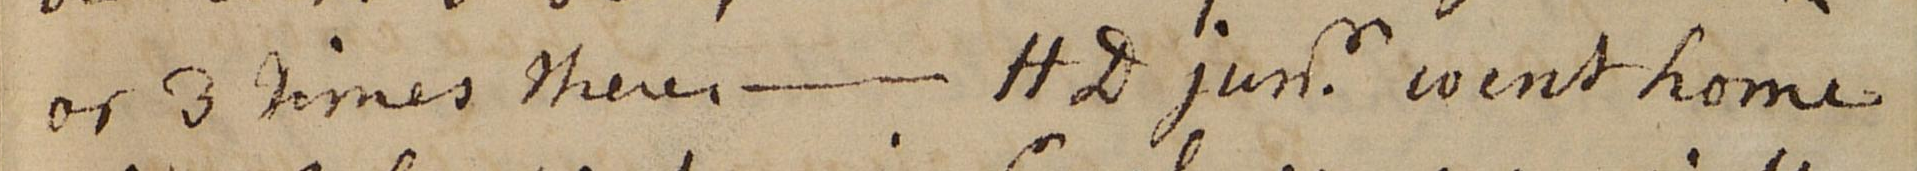of 3 times there.- HD jun^r went home
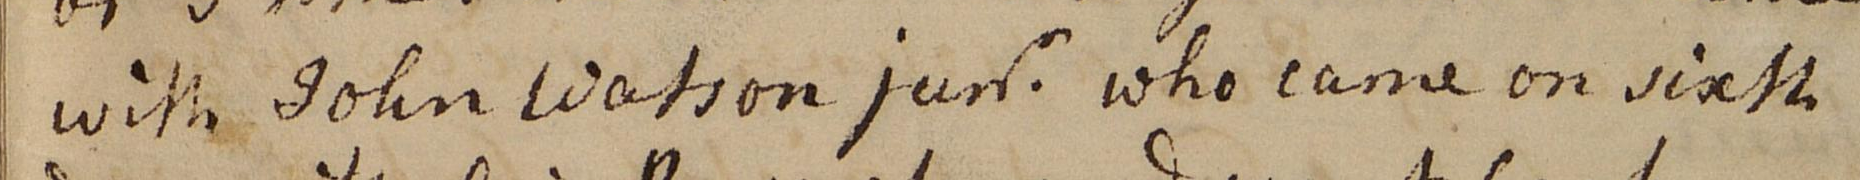with John Watson jun^r who came on sixth
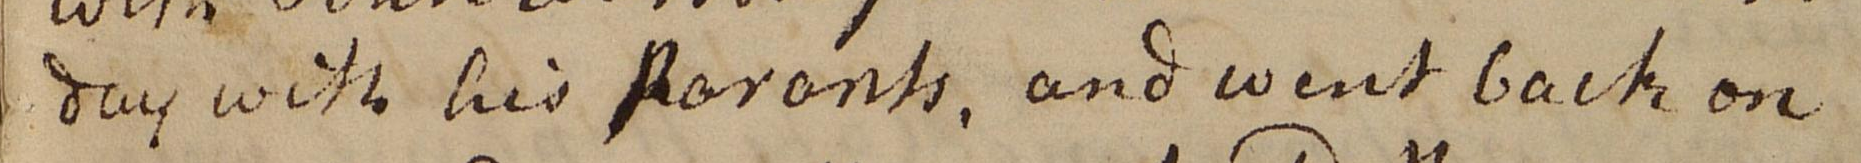day with his Parants, and went back on
